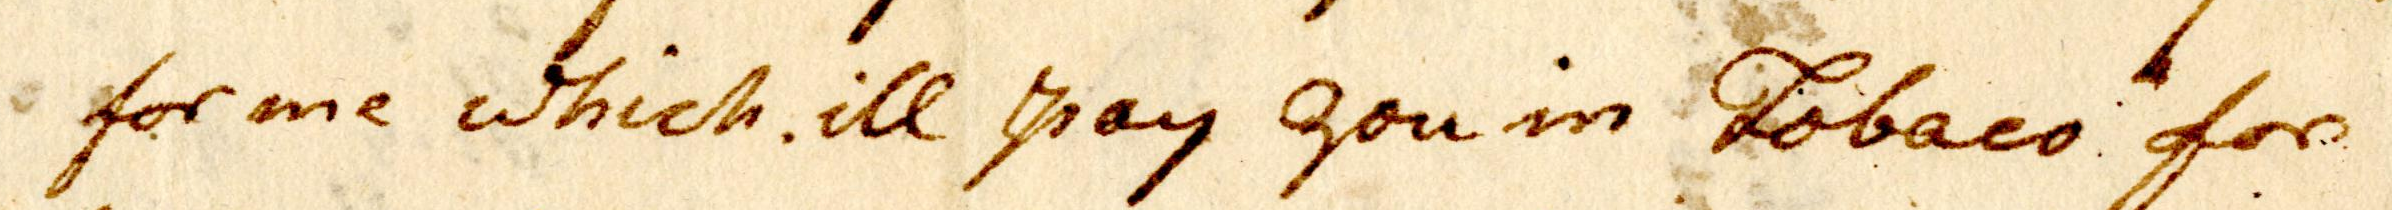for me which ill pay you in Tobaco for
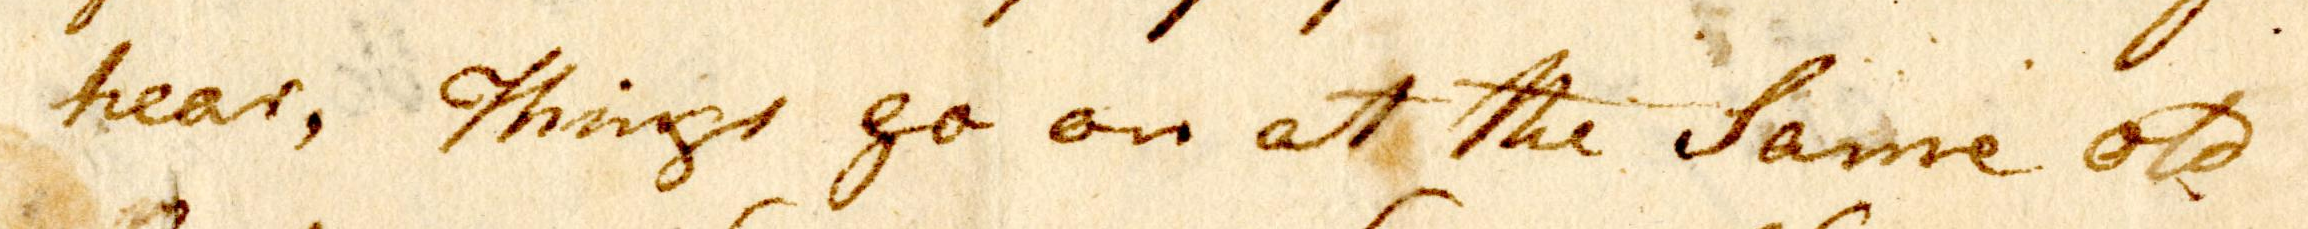hear, Things go on at the Same old
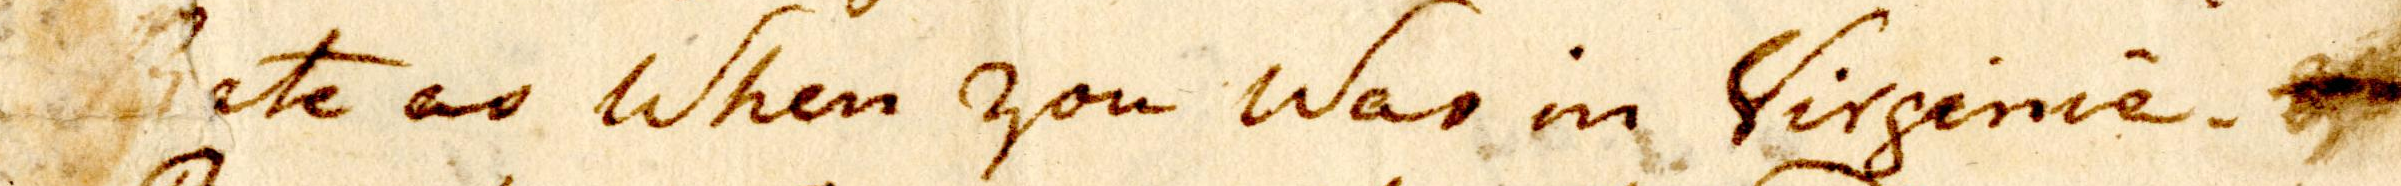Rate as when you was in Virginia. [&]
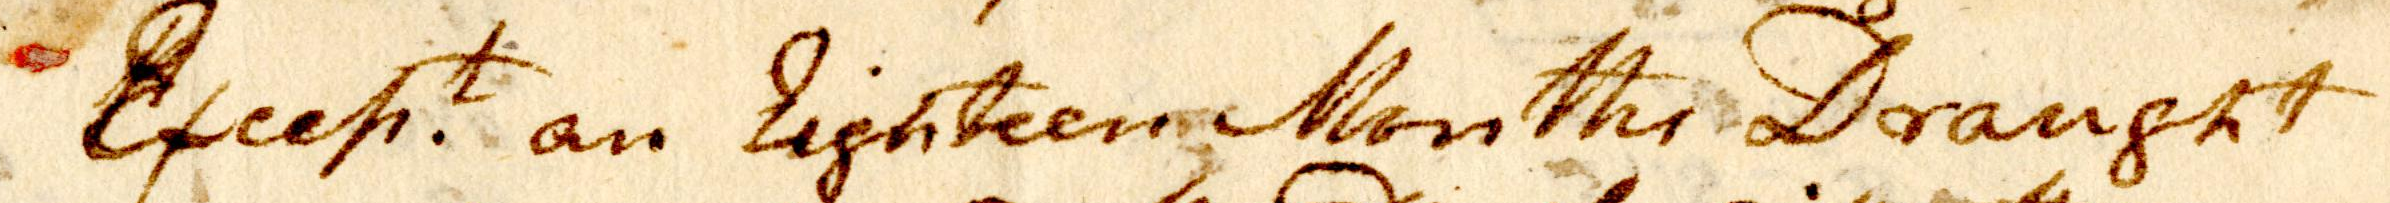Excep^t. an Eighteen Months Draught
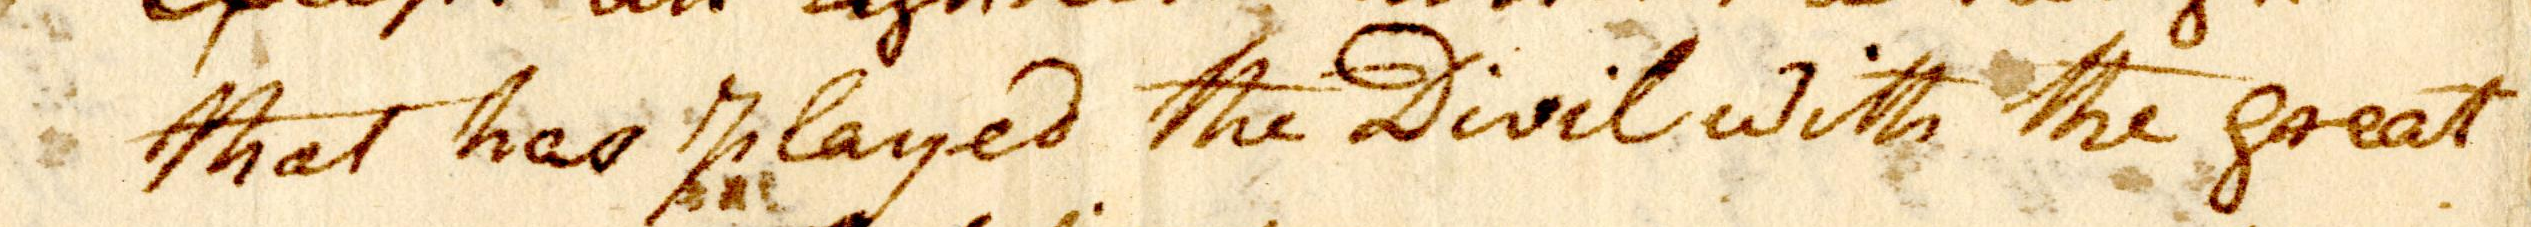that has played the Divil with the great
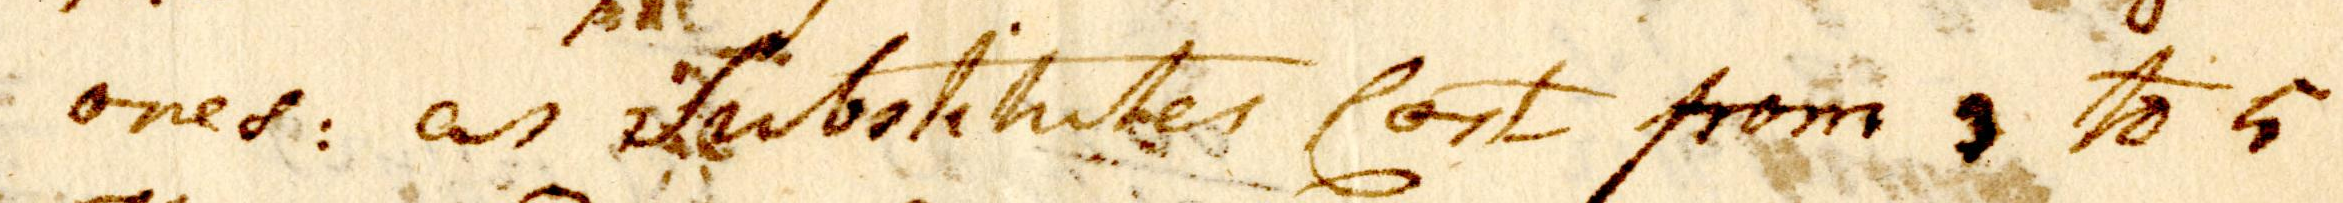ones: as Substitutes Cost from 3 to 5
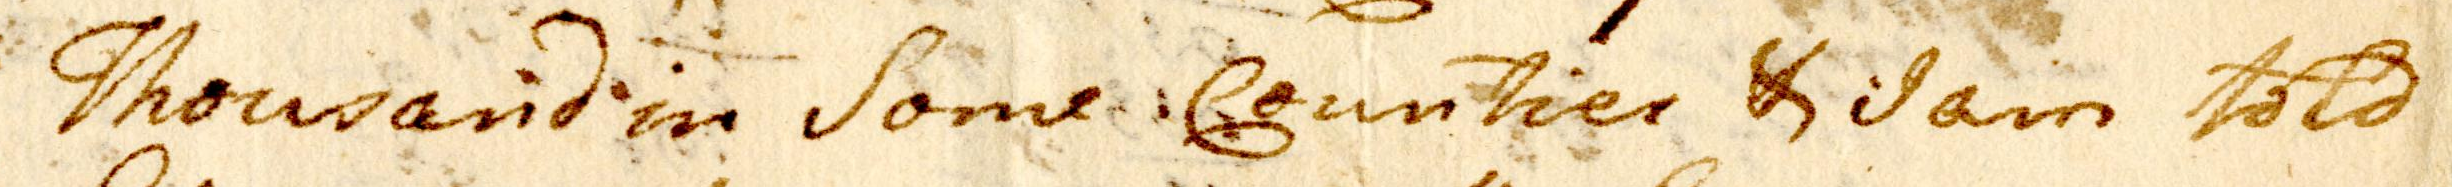Thousand in some Counties & I am told
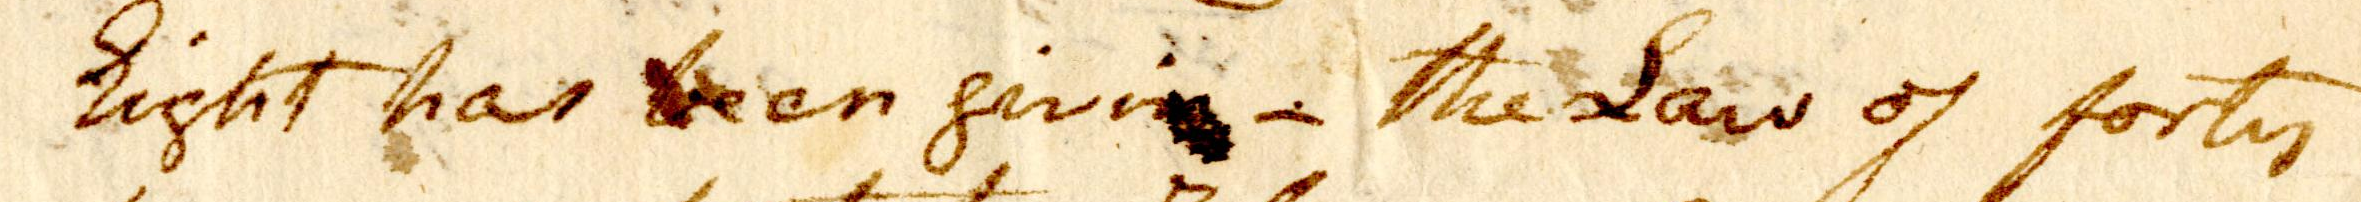Eight has been givin- the Law of forty
